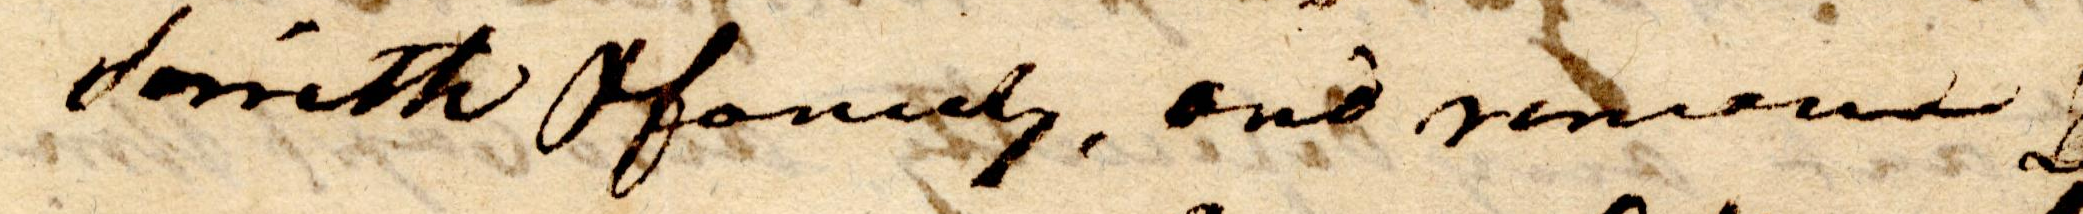Smith & family, and remain
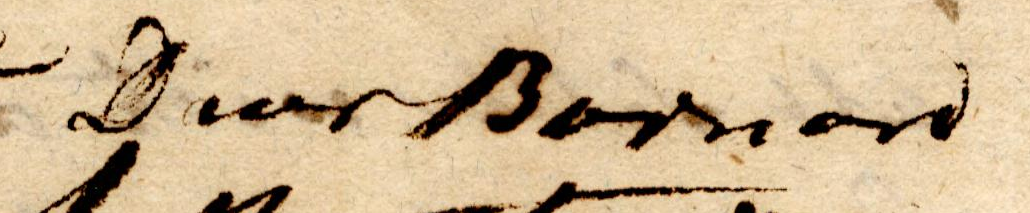Dear Barnard
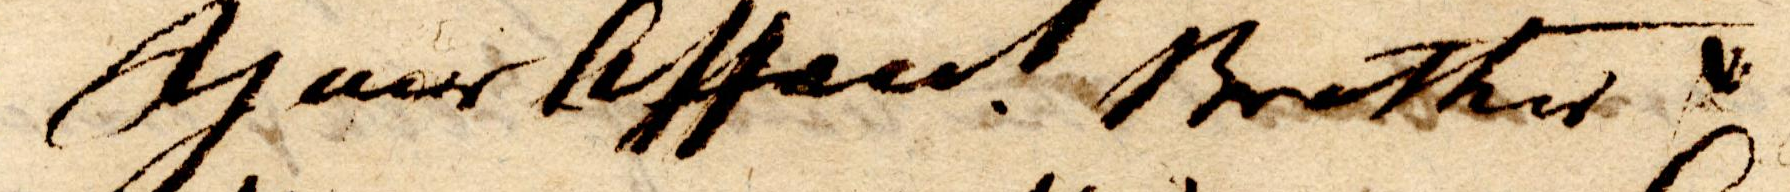Your Affec^t. Brother
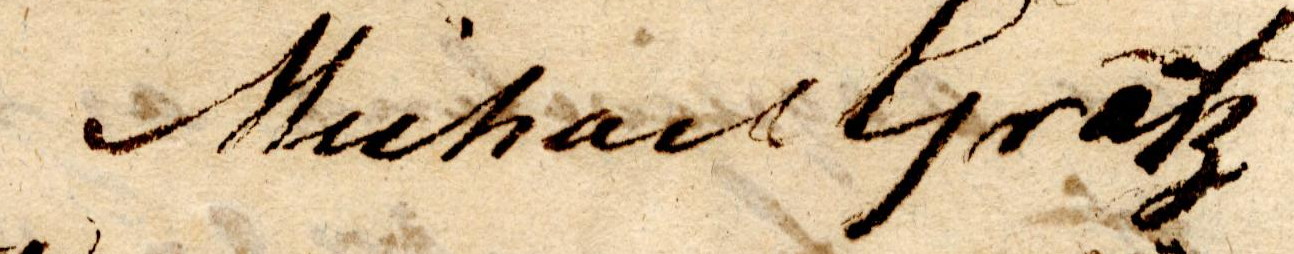Michael Gratz
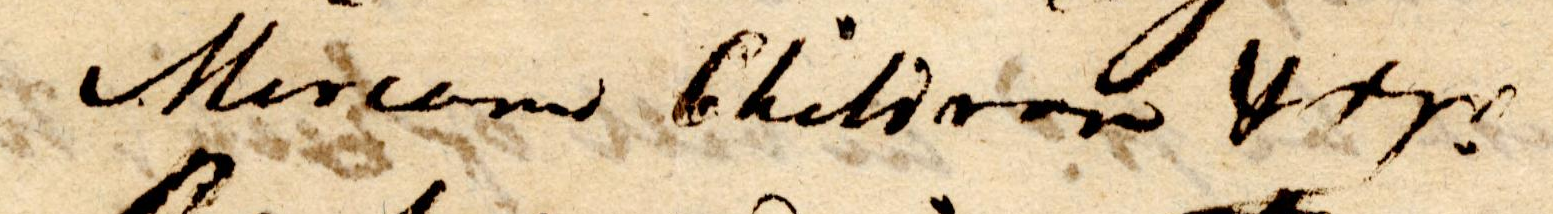Miriam Children & y^r.
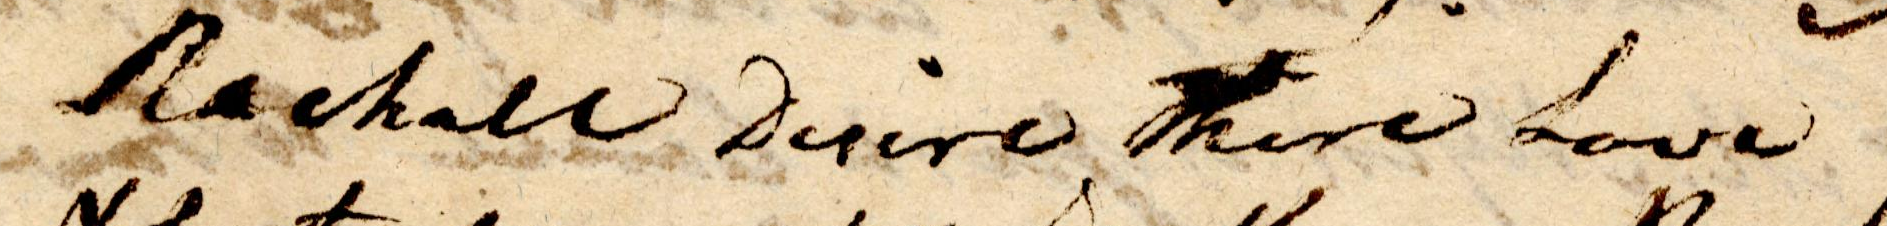Rachall desire there Love
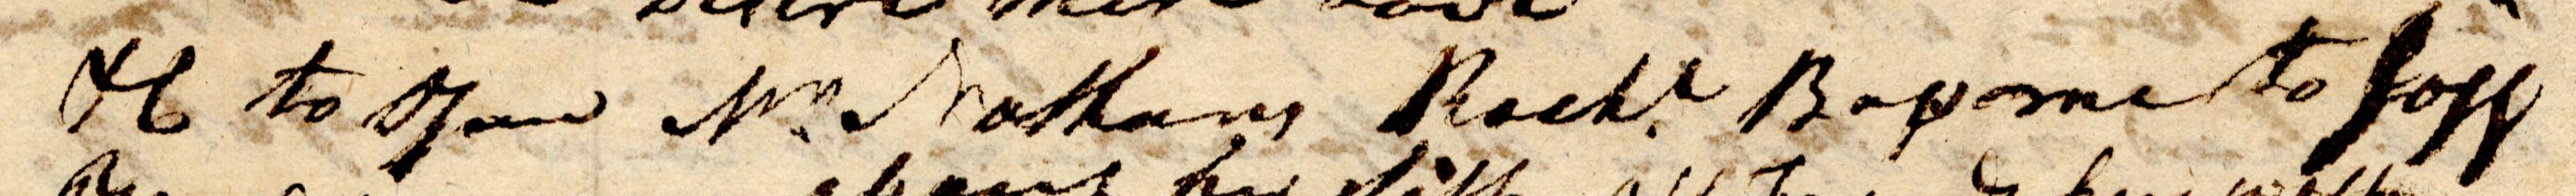&C to you M^r. Nathan Rach^l. Bayorne to loss
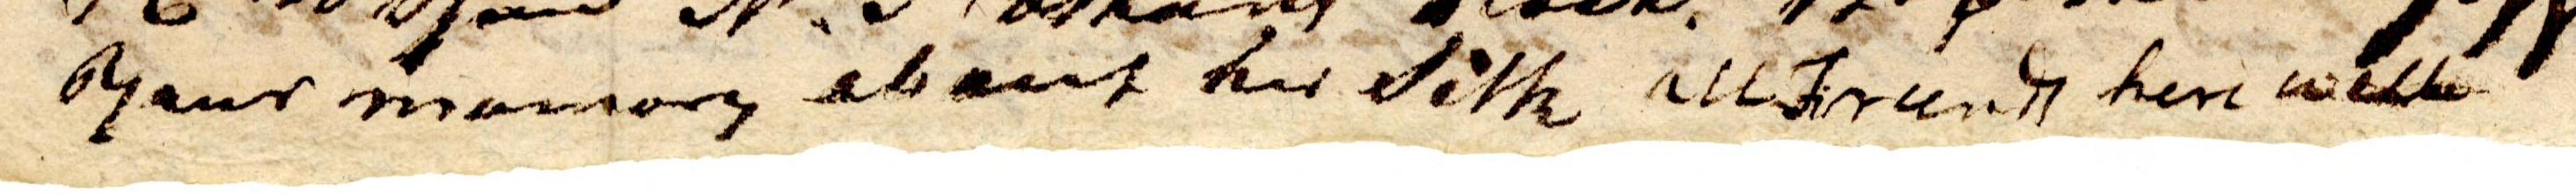your money about his silk all Friends here will
